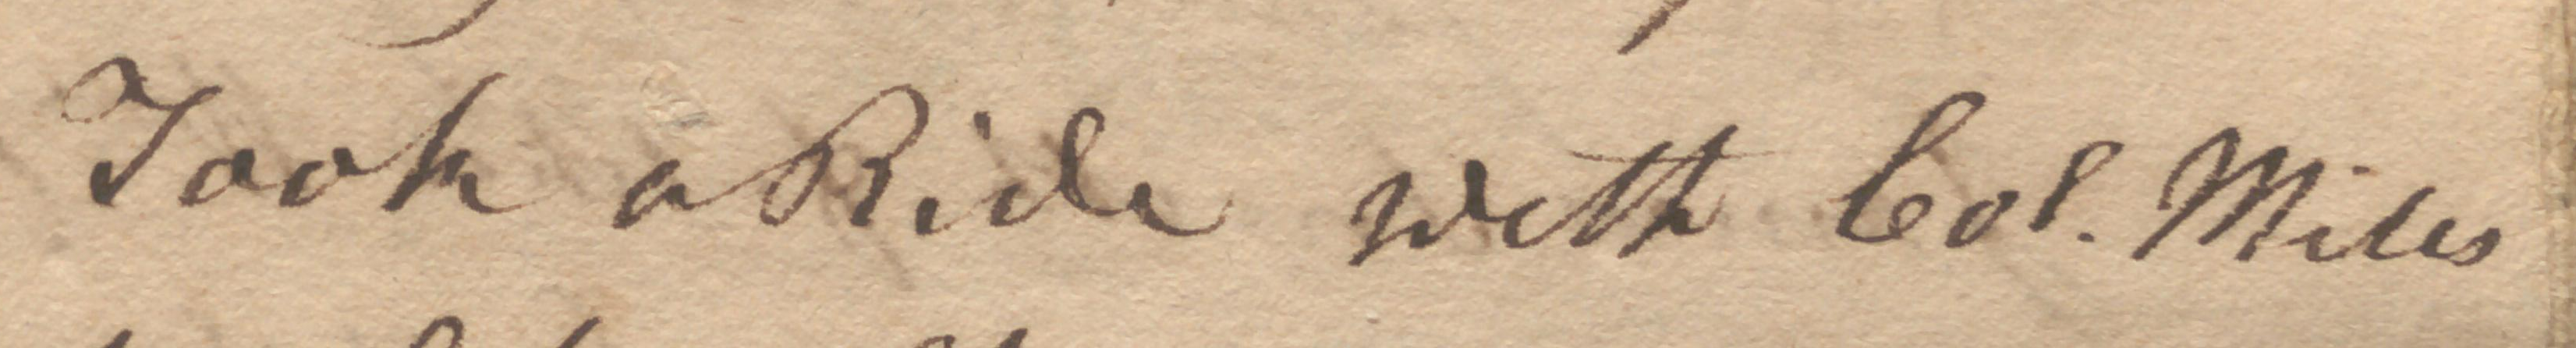Took a Ride with Col. Miles
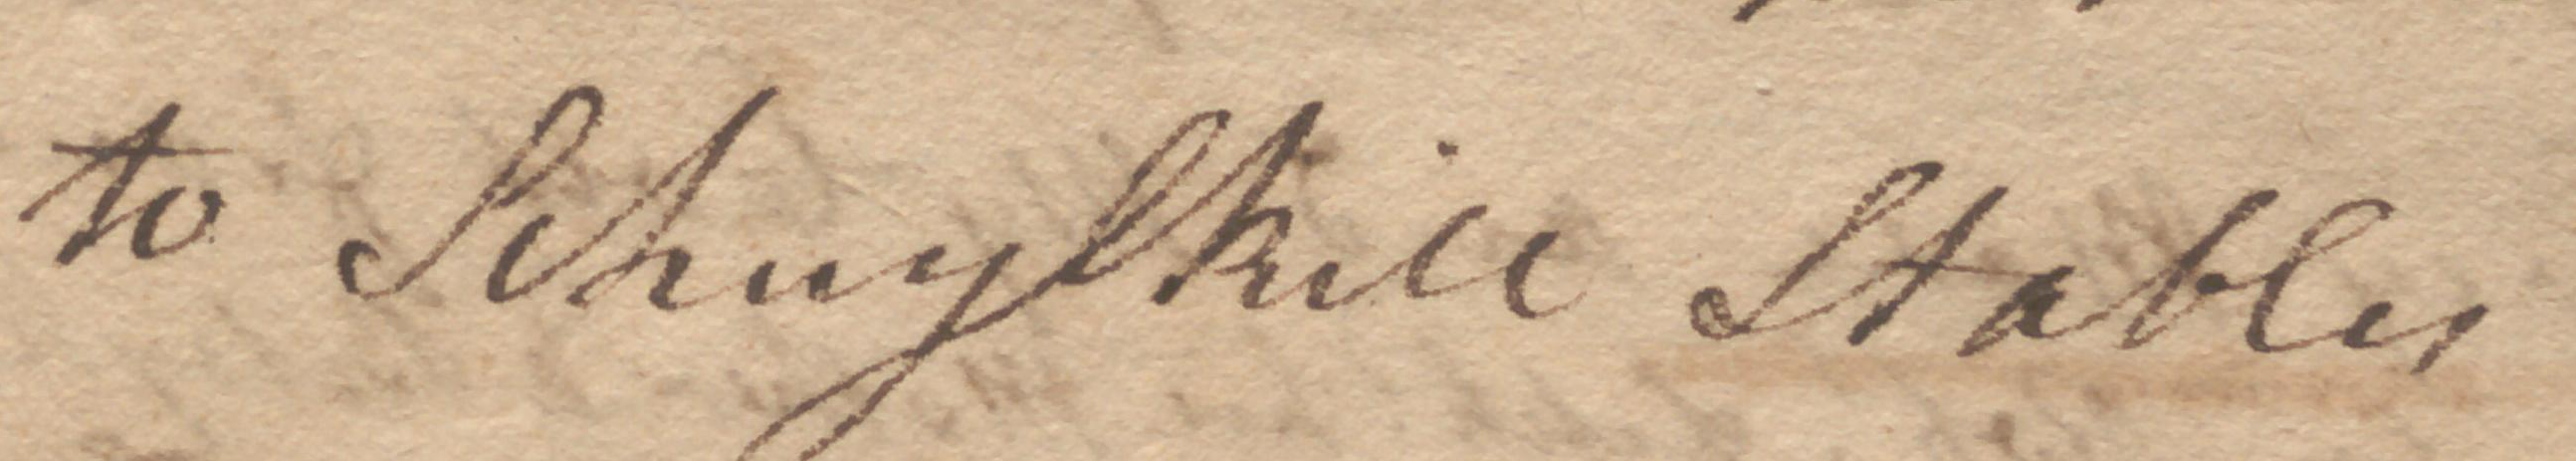to Schuylkill Stables
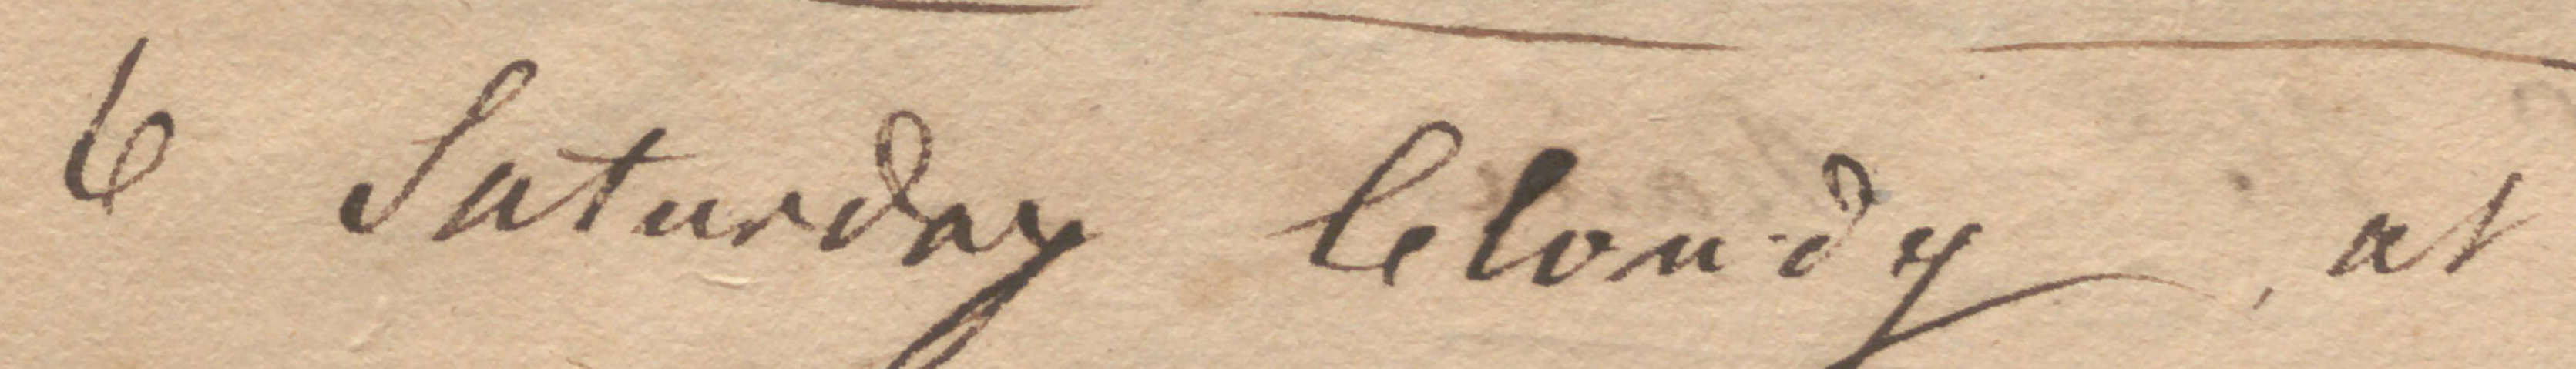6 Saturday Cloudy at
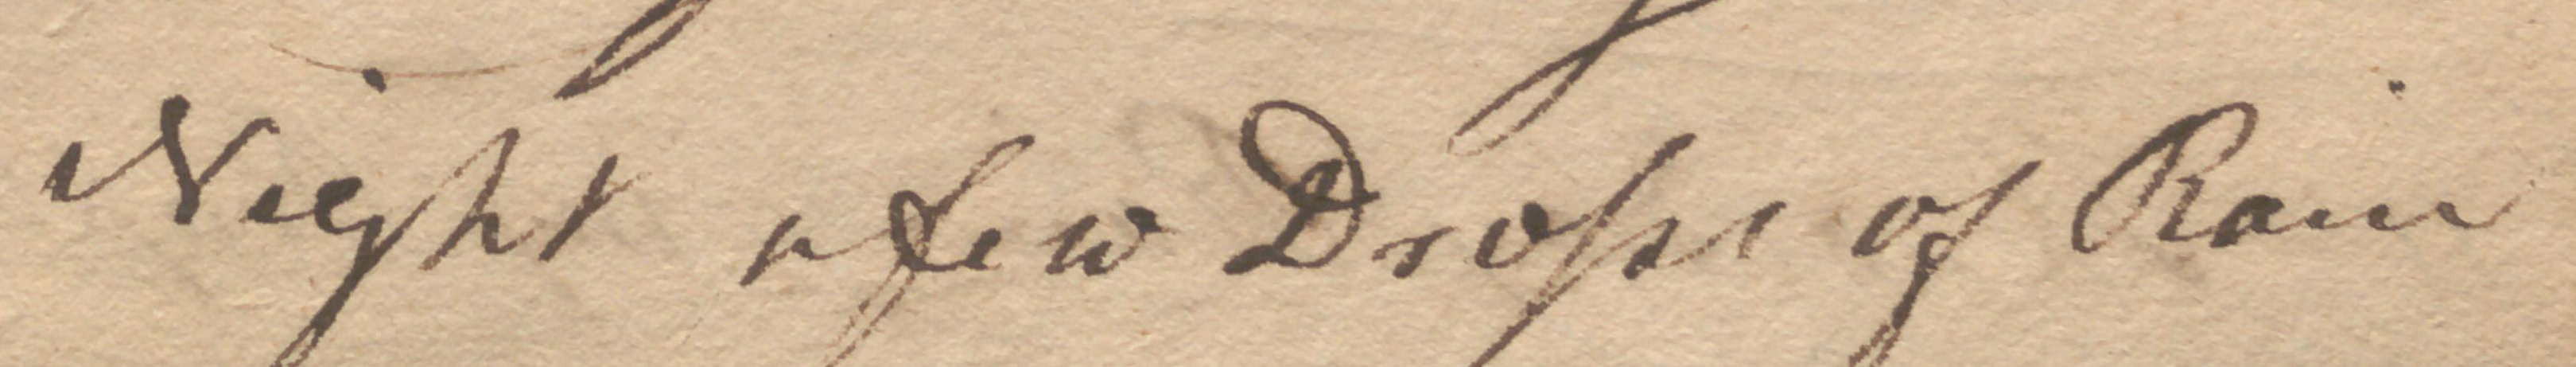Night a few Dropes of Rain
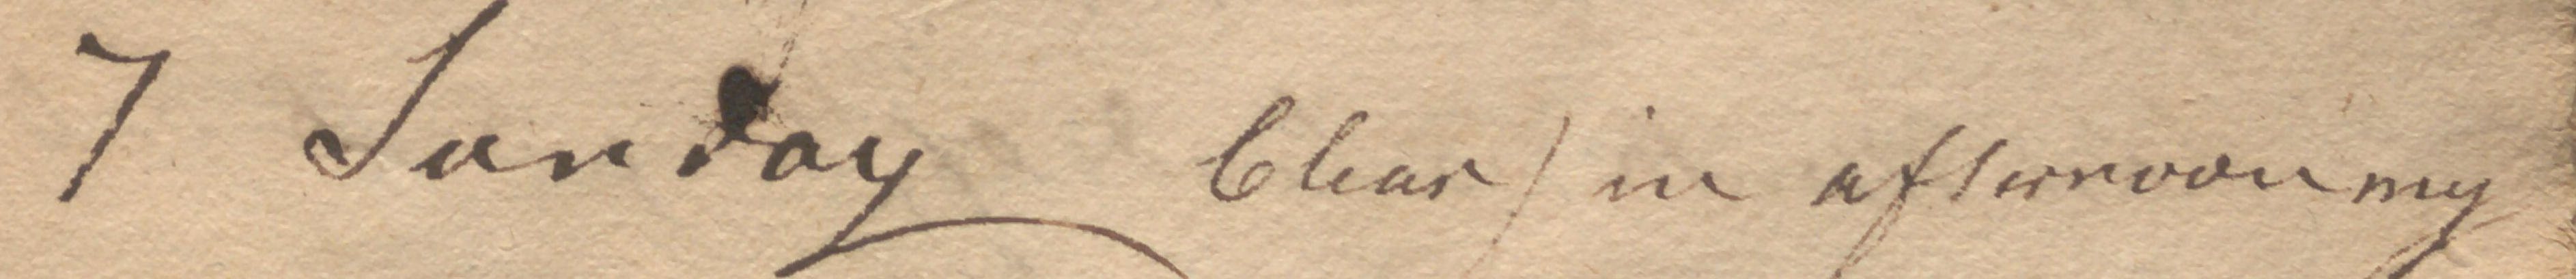7 Sunday Clear in afternoon my
